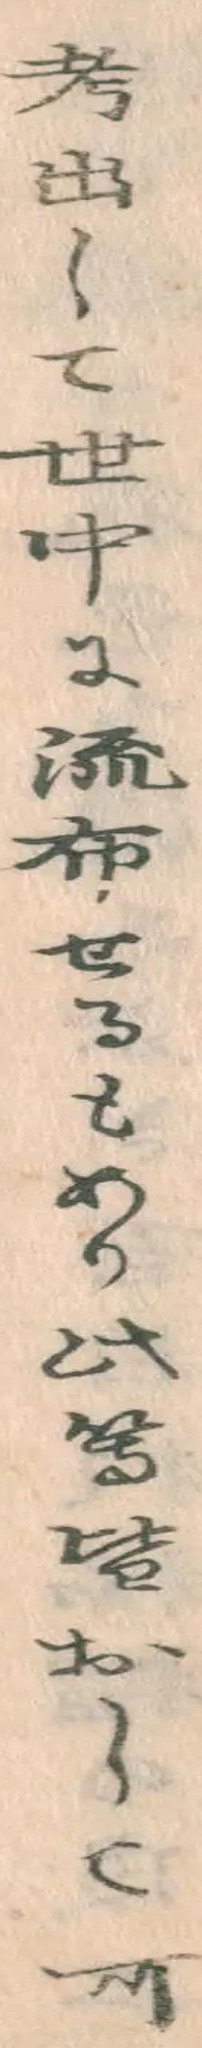考出して世中に流布せるもあり此等皆おして可
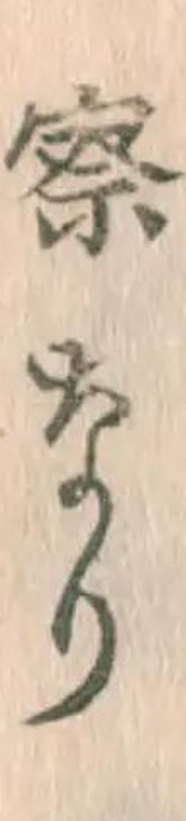察なり
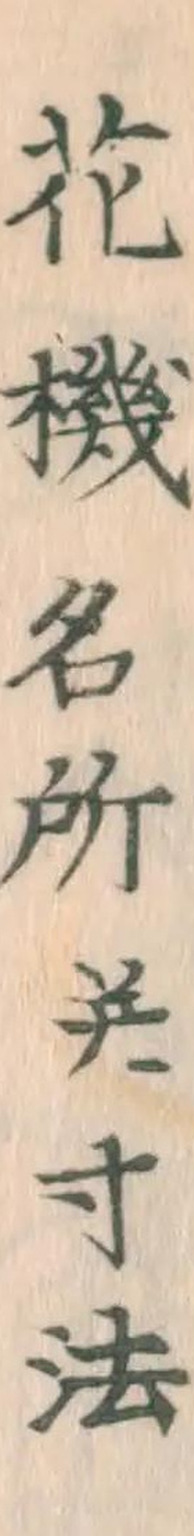花機名所幷寸法
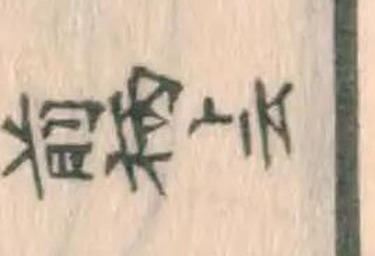前柄ト云
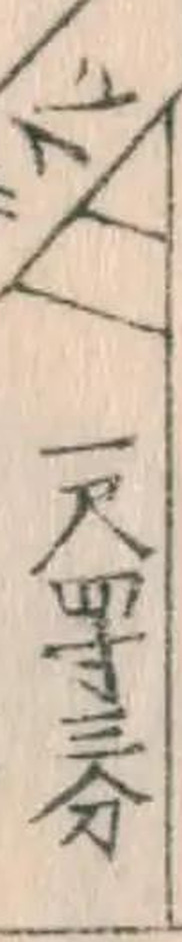ツマキ一尺四寸三分
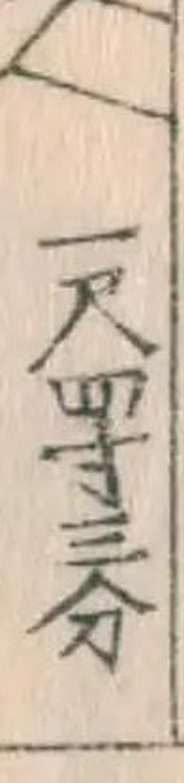一尺八寸三分
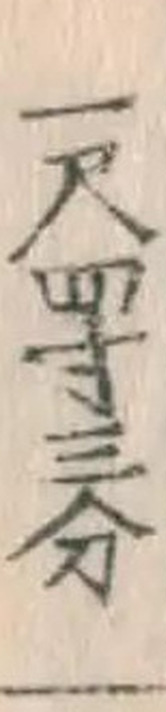一尺八寸三分
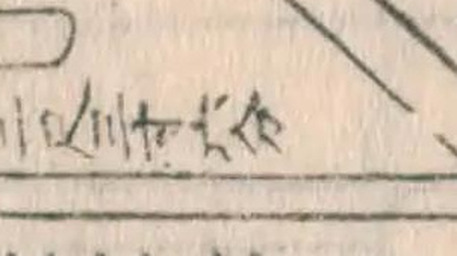二尺七寸六寸
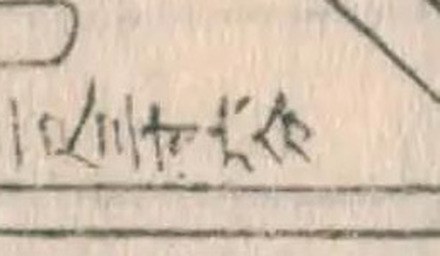二尺七寸六寸
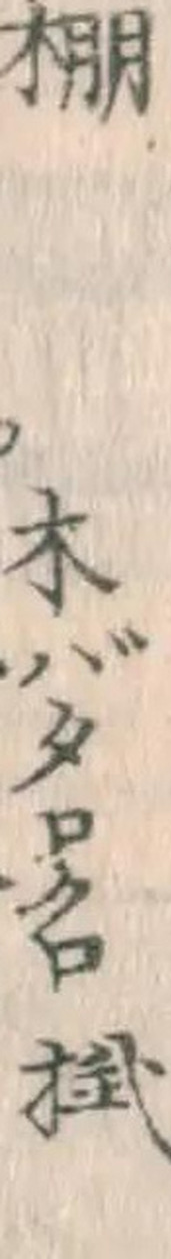木バタロクロ掛
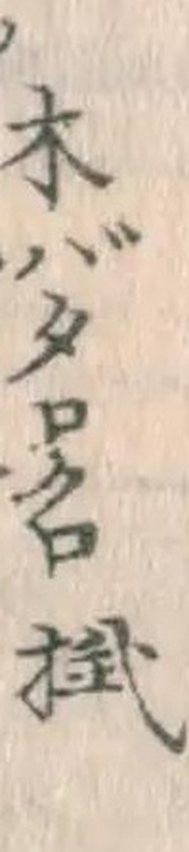木バタロクロ掛
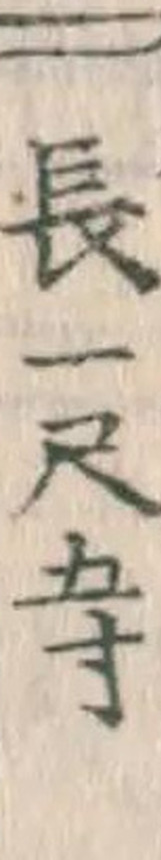長一尺五寸
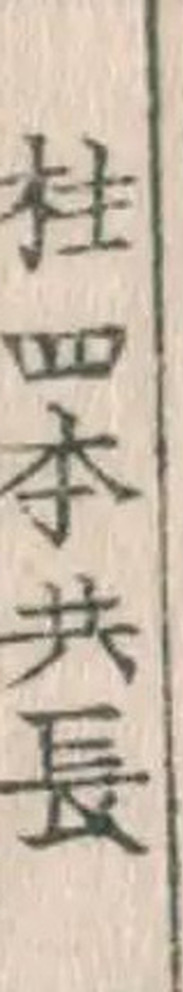桂四本共長
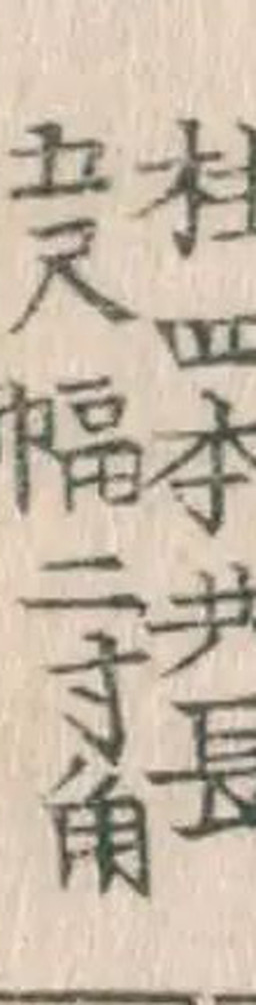五尺幅二寸角
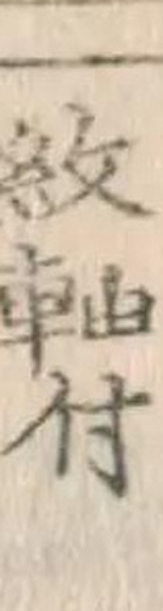紋軸付
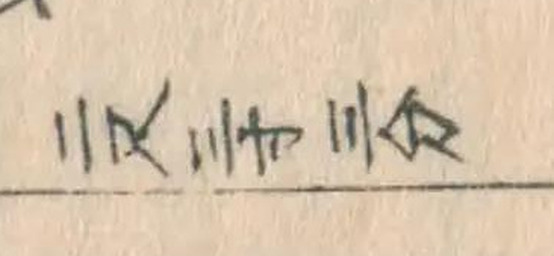二尺四寸九分
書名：機織彙編 5巻. [1]
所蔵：国立国会図書館 National Diet Library, JAPAN
